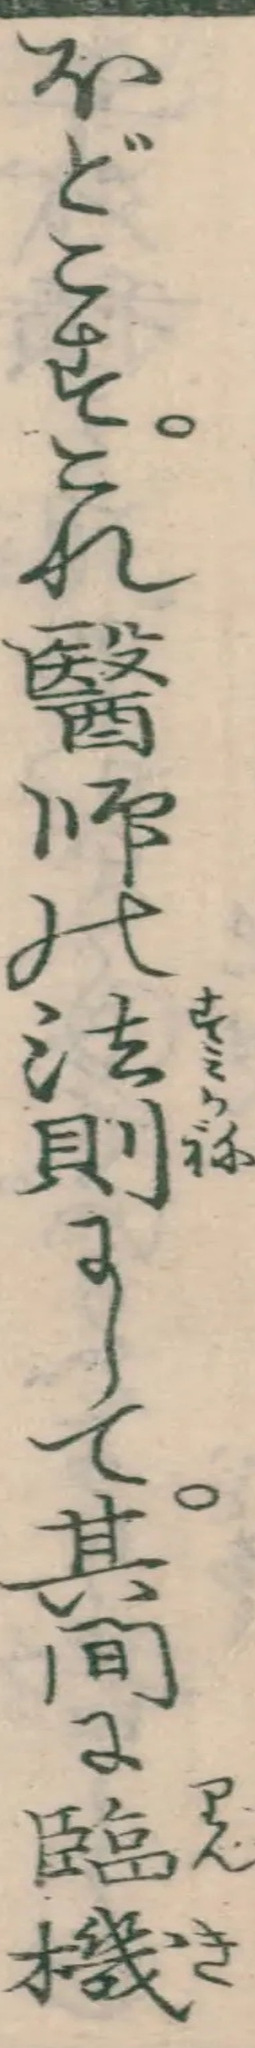ほどこす。これ醫師の法則にして。其間に臨機
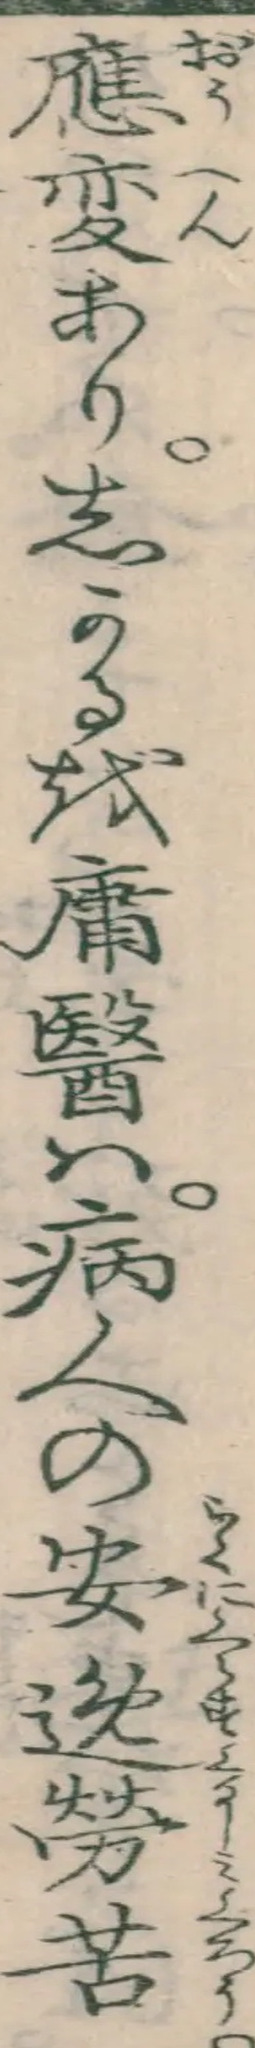應変あり。しかるを庸醫は。病人の安逸労苦。
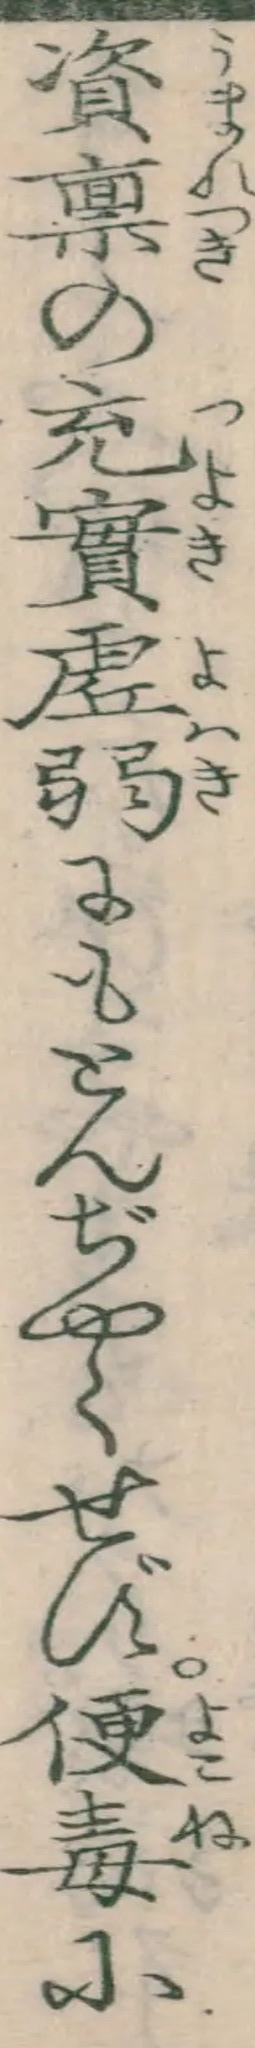資稟の充實虚弱にもとんぢやくせず。便毒に
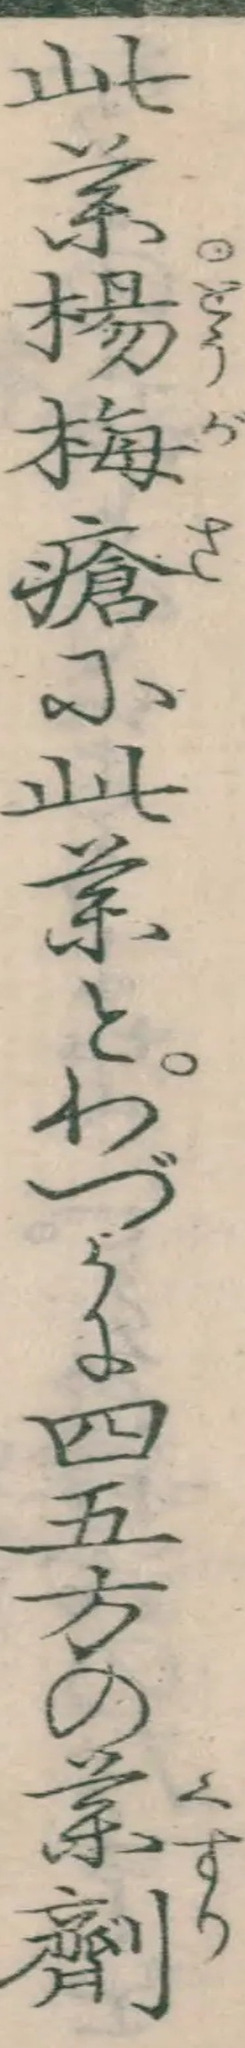此薬。楊梅瘡に此薬と。わづかに四五方の薬劑
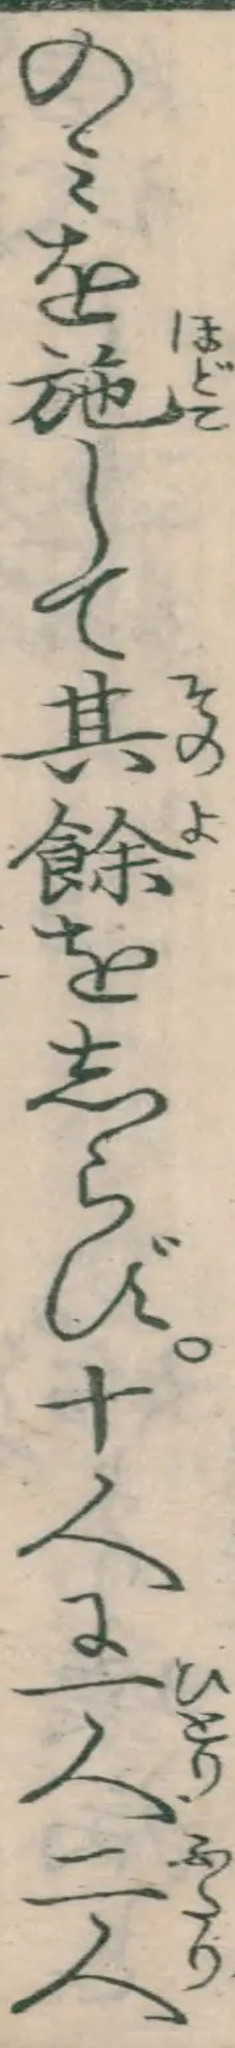のみを施して其餘をしらず。十人に一人二人
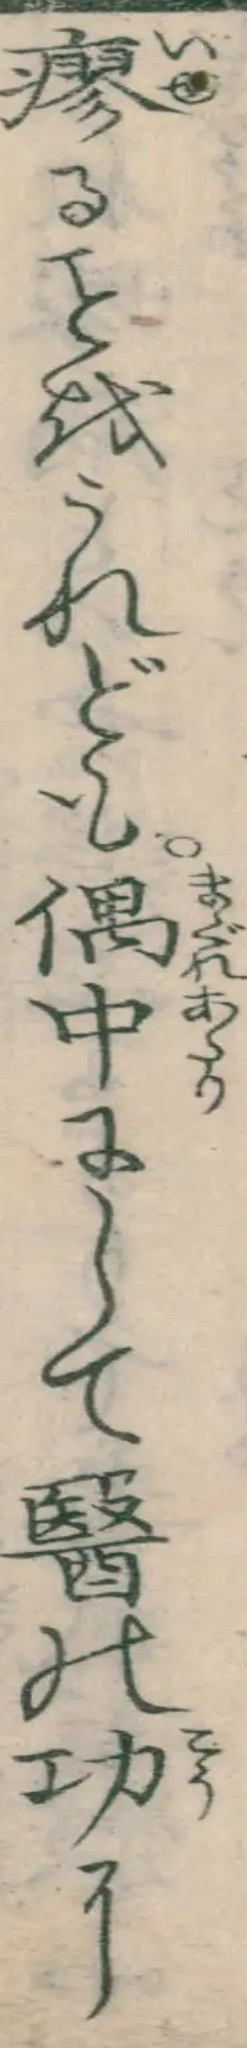瘳ることをうれども。偶中にして醫の功に
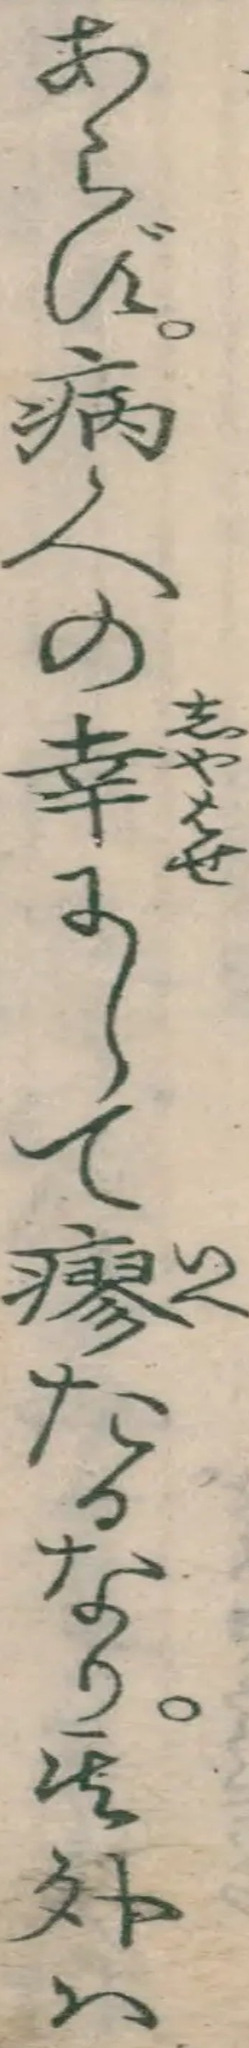あらず。病人の幸にして瘳たるなり。其外は

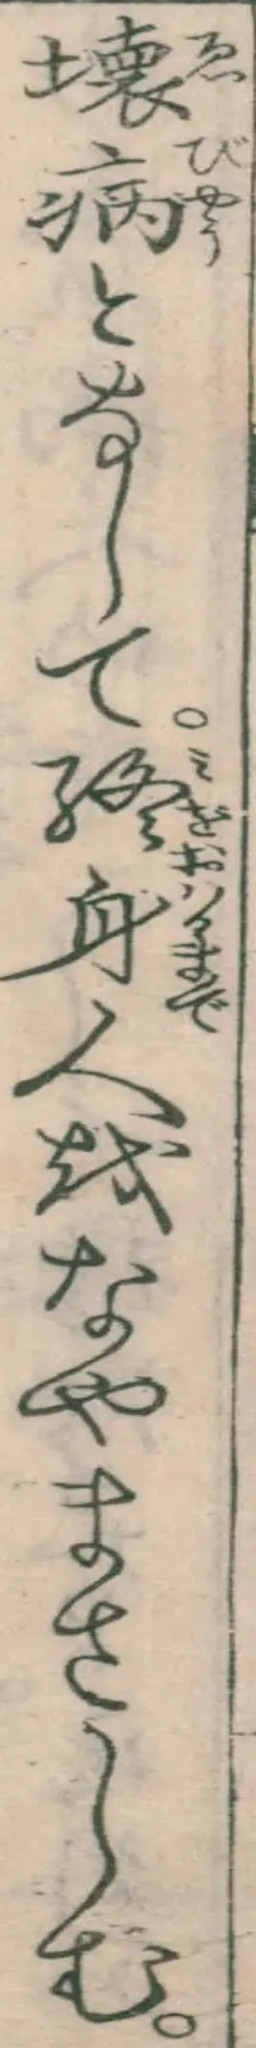壊病となして。終身人をなやまさしむ。
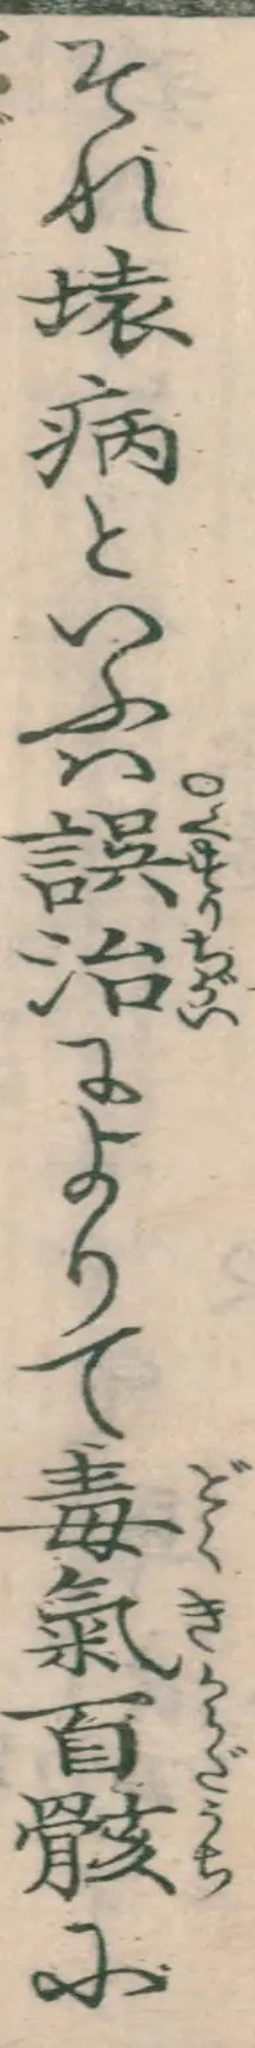それ壊病といふは。誤治によりて毒氣百骸に
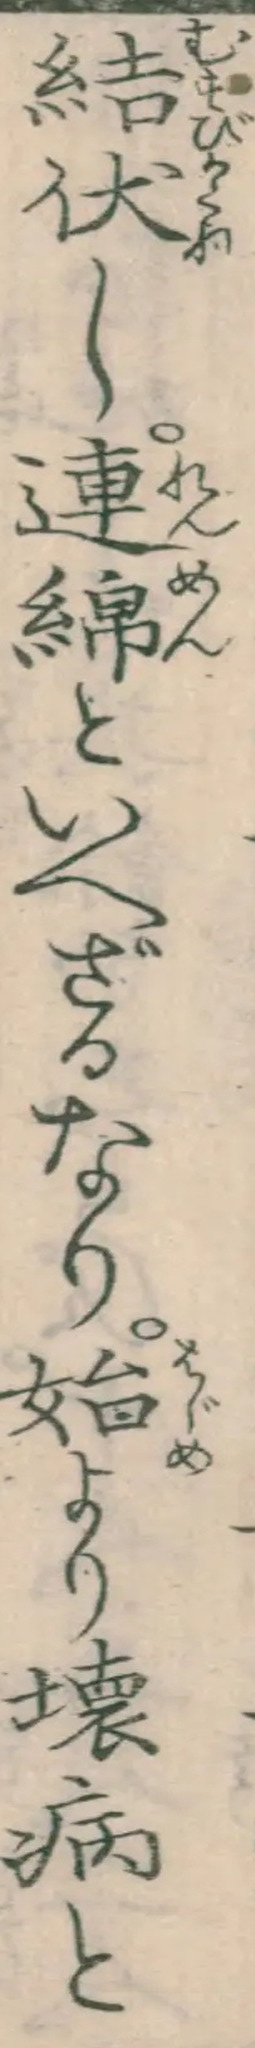結伏し。連綿といへざるなり。始より壊病と
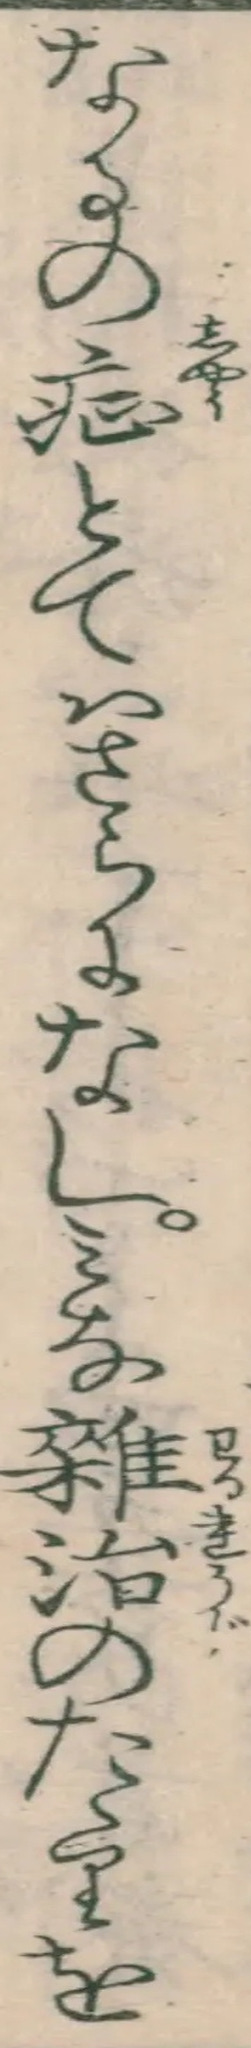なるの症とてはさらになし。雜治のたりを
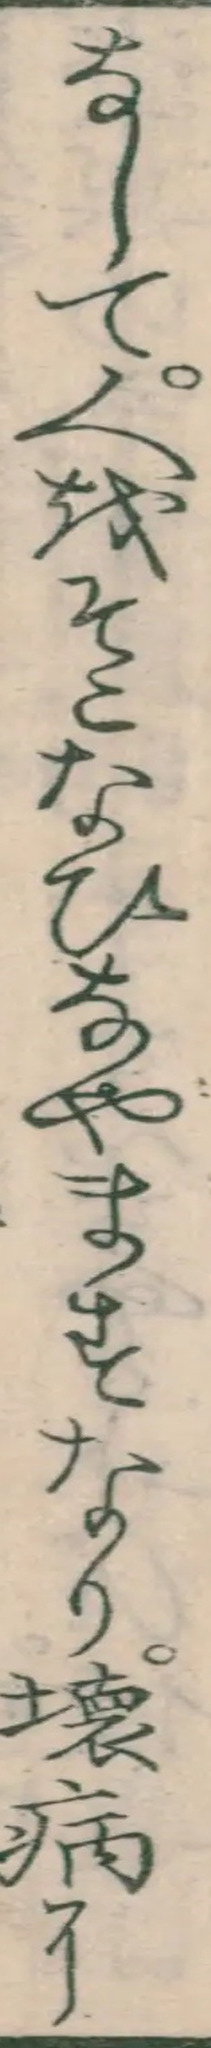なして。人をそこなひなやますなり。壊病に
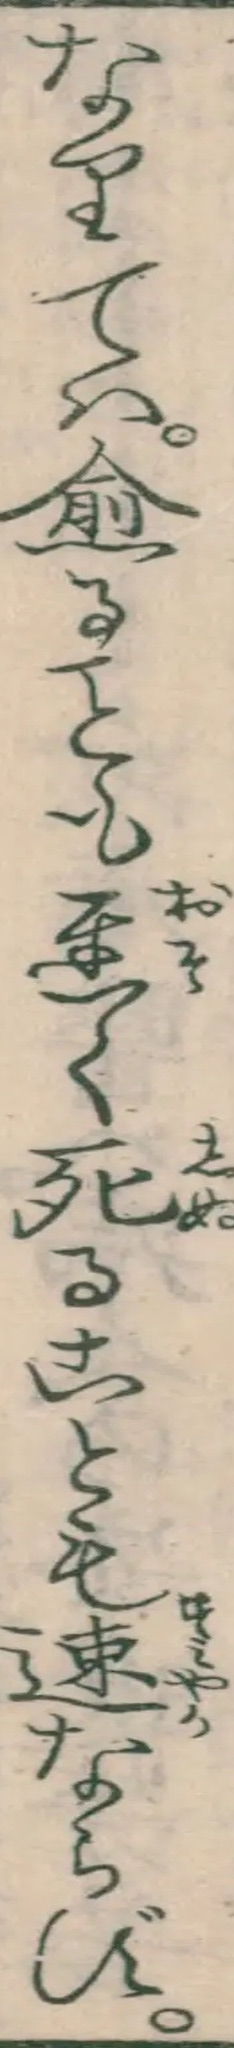なりては。愈ることも遅く死ることも速ならず。
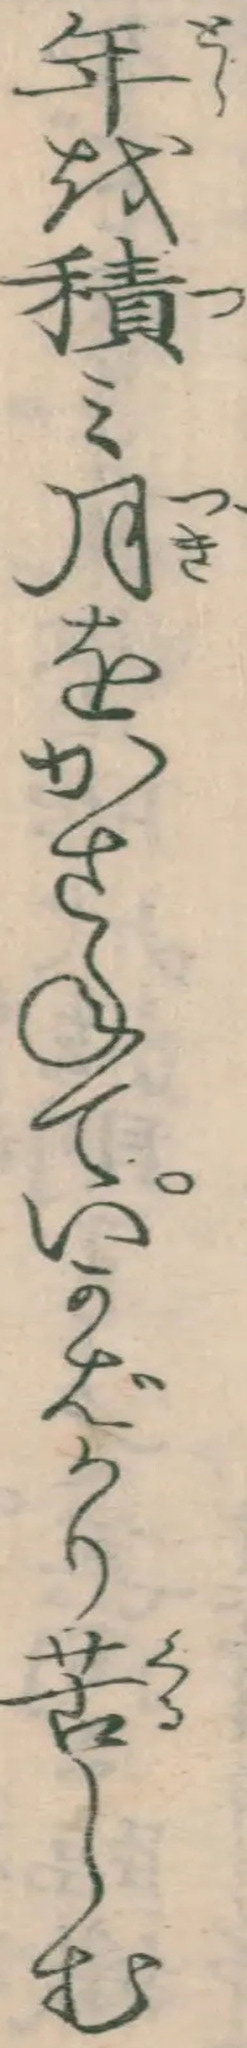年を積み月をかされて。いかばかり苦しむ
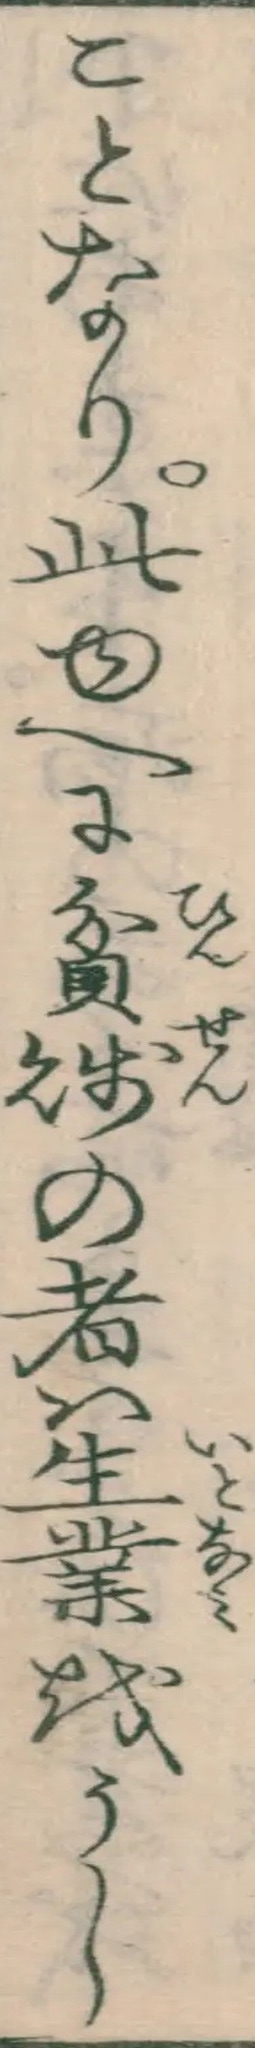ことなり。此ゆへに貧賤の者は生業をうし
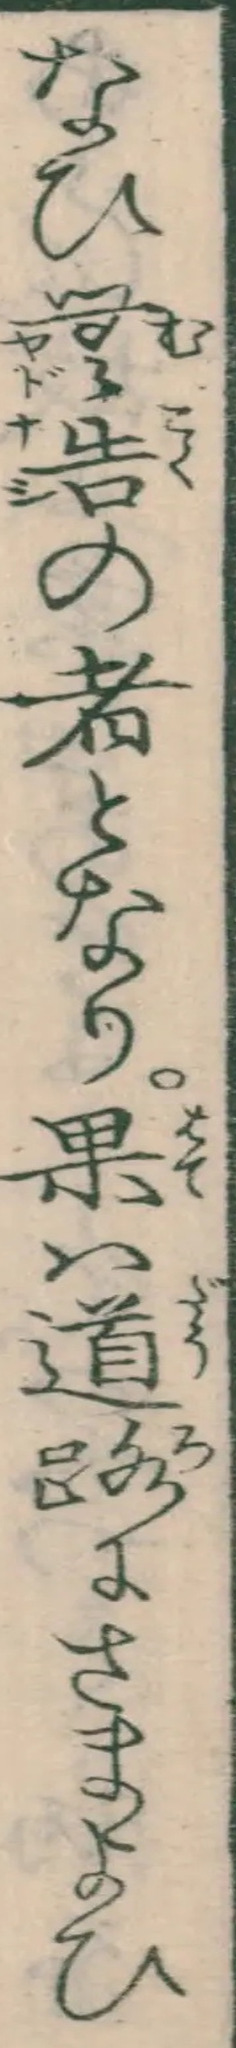なひ無告の者となり。果は道路にさまよひ
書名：瘡家示訓
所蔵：国立国会図書館 National Diet Library, JAPAN
